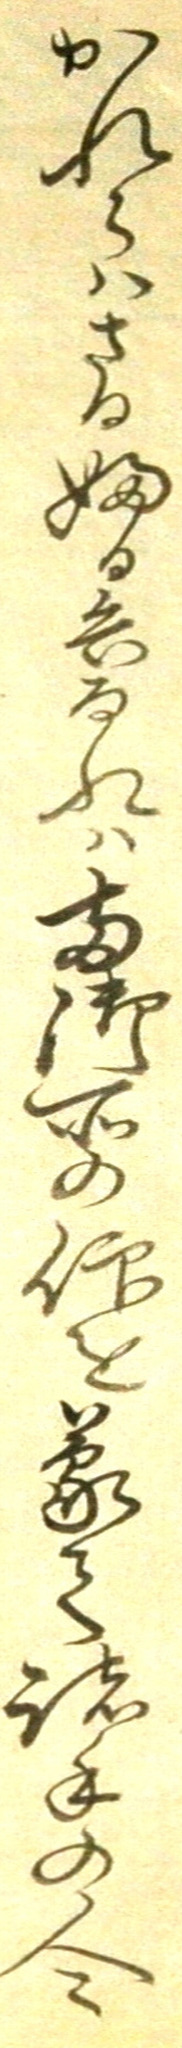かれらはさるふる兵なれは両御所の仰を蒙て諸手の人々
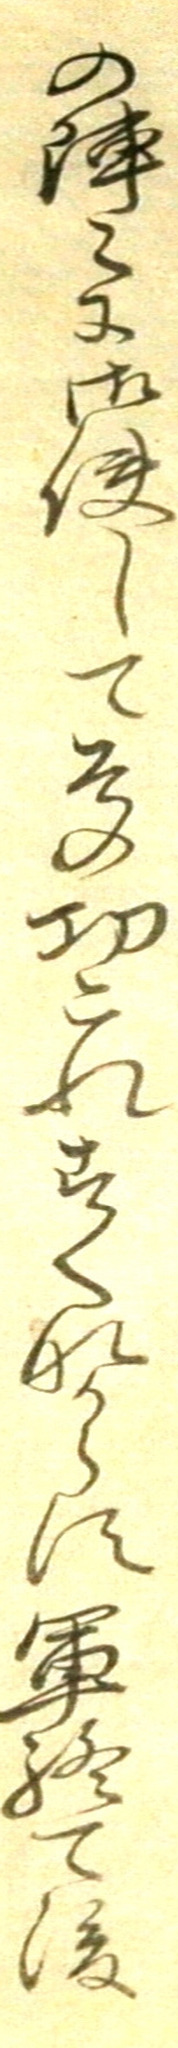の陣々に御使してその功これすくなからす軍終て後
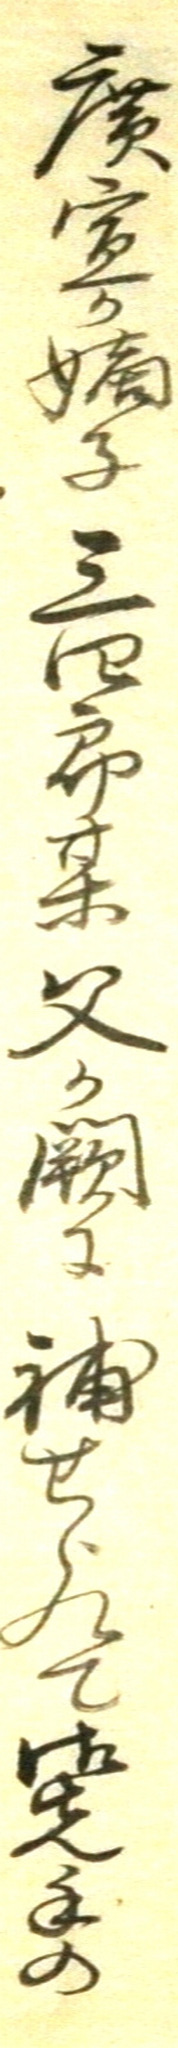広宣か嫡子三四郎某父か闕に補せられて御先手の
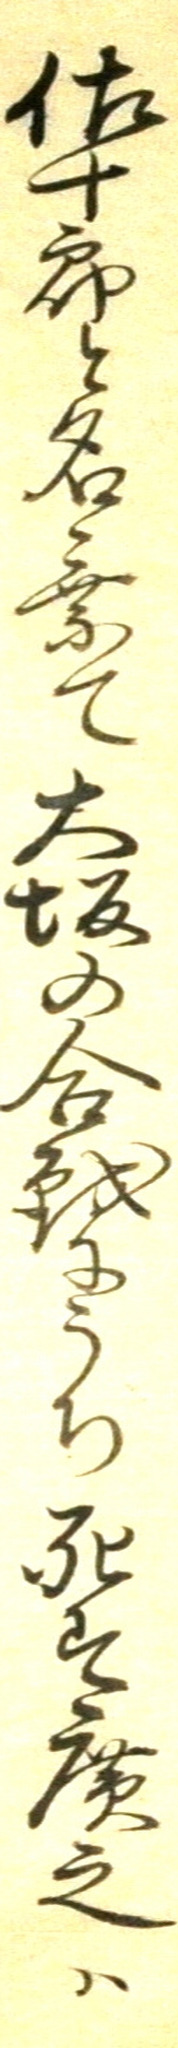佐十郎と名乗て大坂の合戦にうち死す広之は
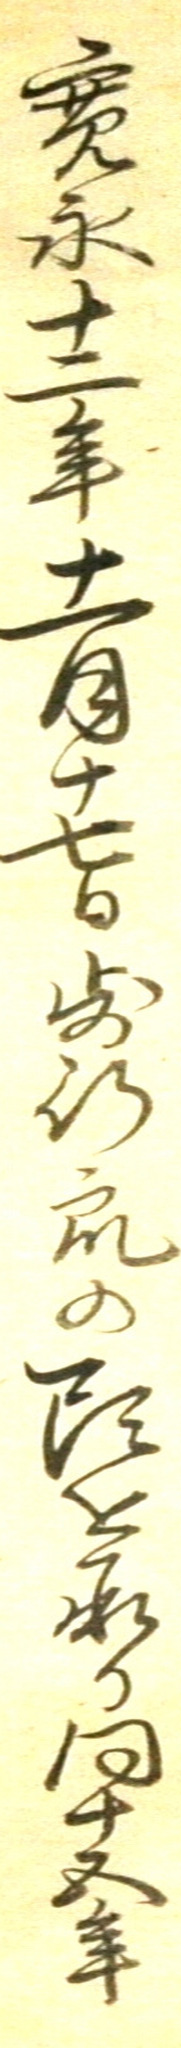寛永十二年十一月十七日歩行衆の頭を承り同十五年
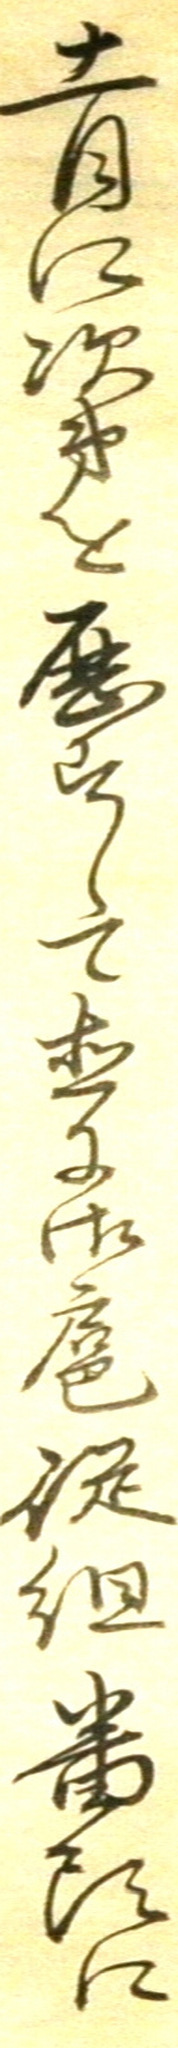十一月に次第を歴すして直に御扈従組番頭に
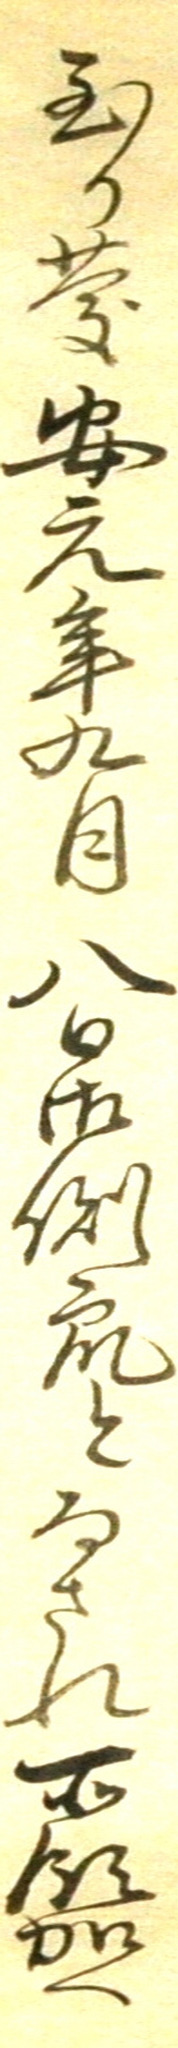至り慶安元年九月八日御側衆となされ所領加へ
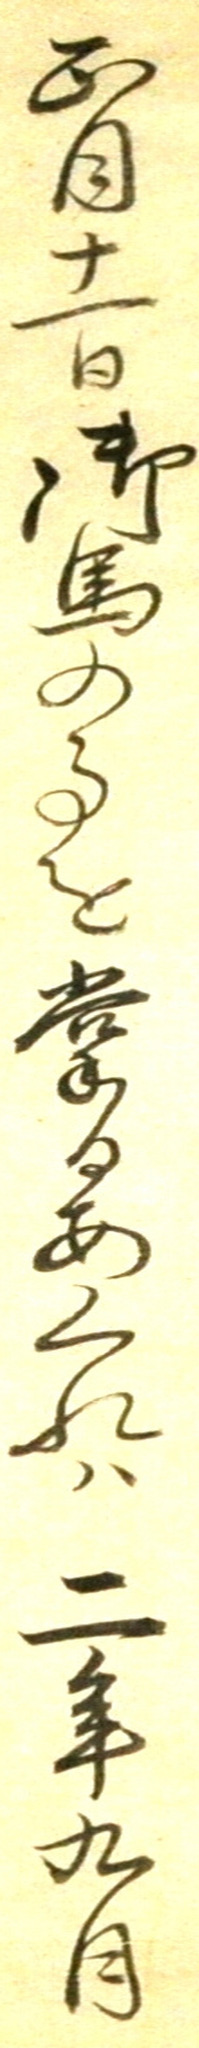正月十一日御馬の事を掌るあくれは二年九月
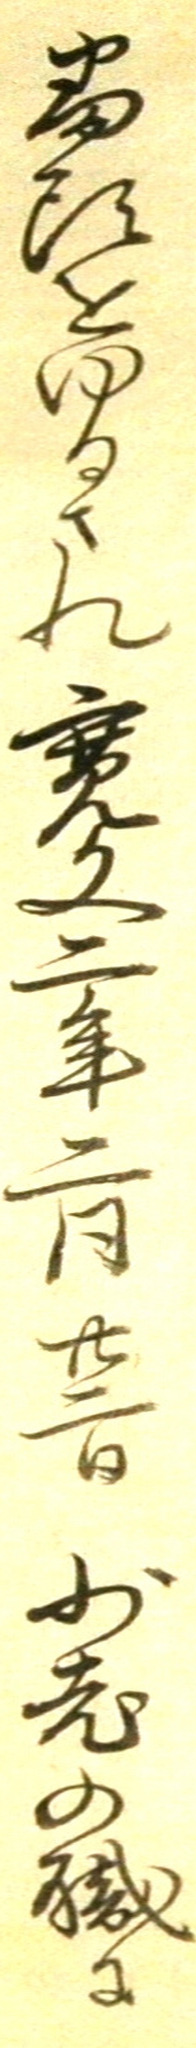番頭をゆるされ寛文二年二月廿二日少老の職に
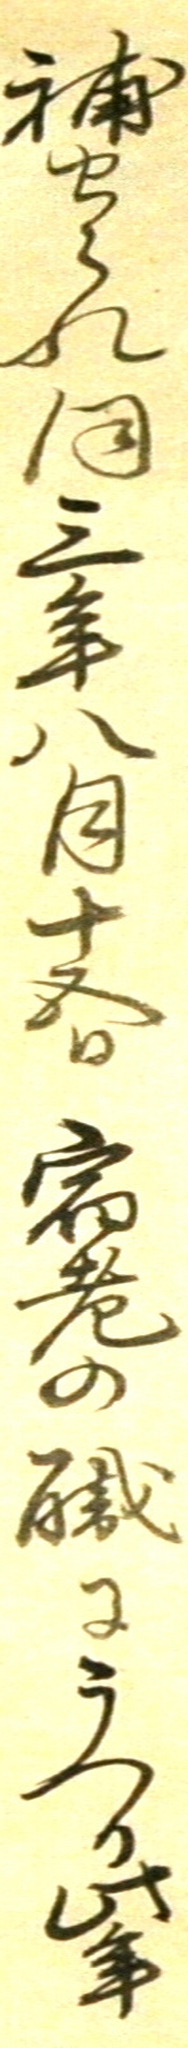補せられ同三年八月十五日宿老の職にうつり此年
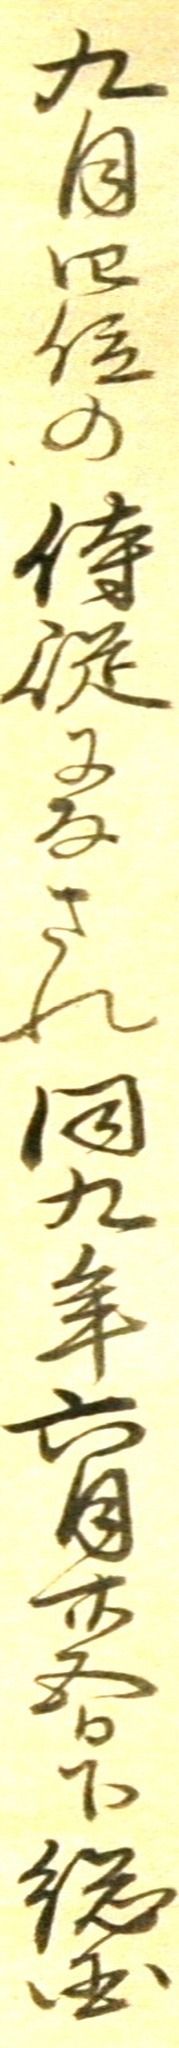九月四位の侍従になされ同九年六月廿五日下総国

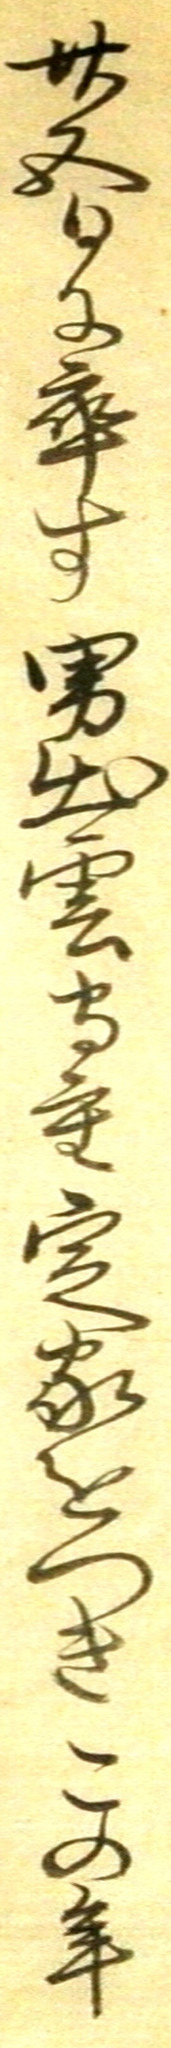廿後日に卒す男出雲守重定家をつきこの年
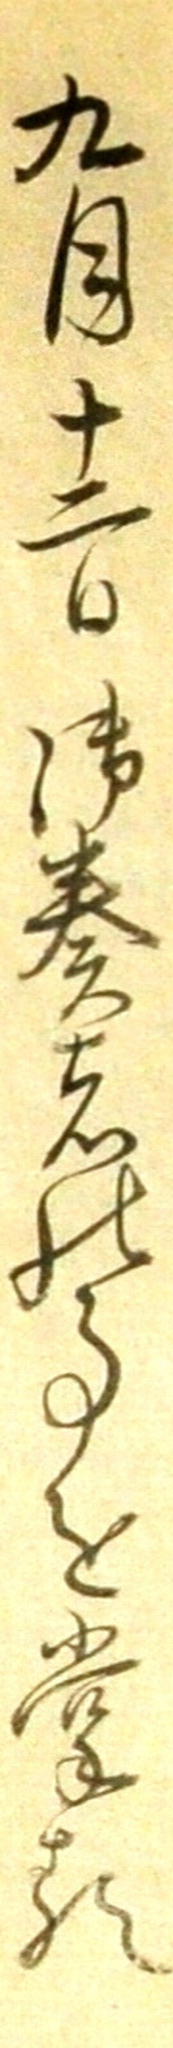九月十二日御奏者の事を掌る
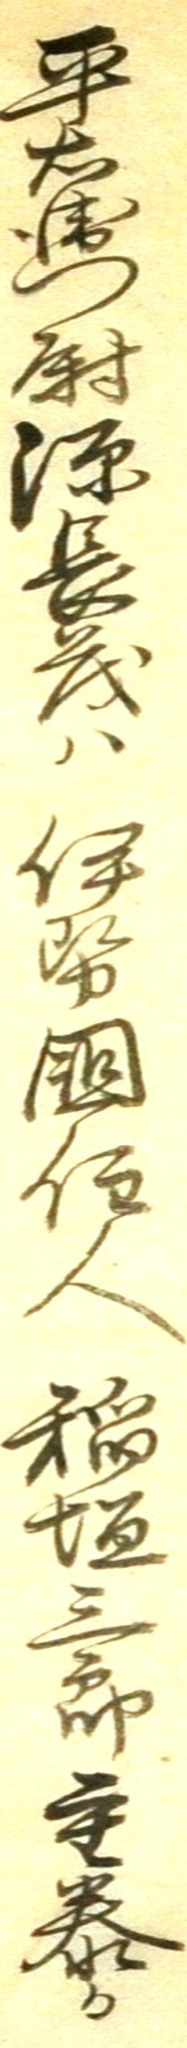平右衛門尉源長茂は伊勢国住人稲垣三郎重泰か
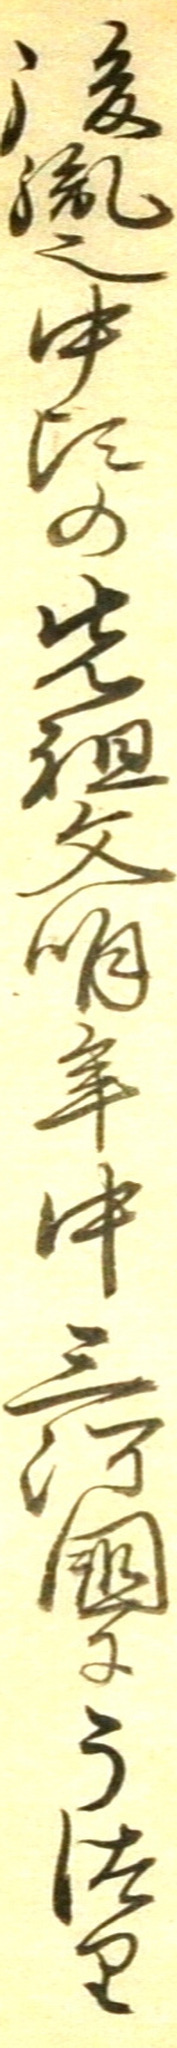後胤也中頃の先祖文明年中三河国にうつり
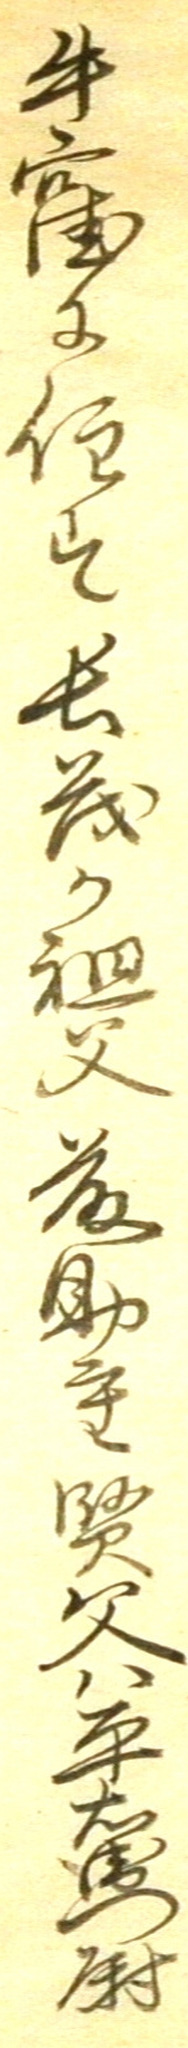牛窪に住す長茂か祖父藤助重賢父は平右衛門尉
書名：藩翰譜（五）
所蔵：伊那市立高遠町図書館・合同会社AMANE
